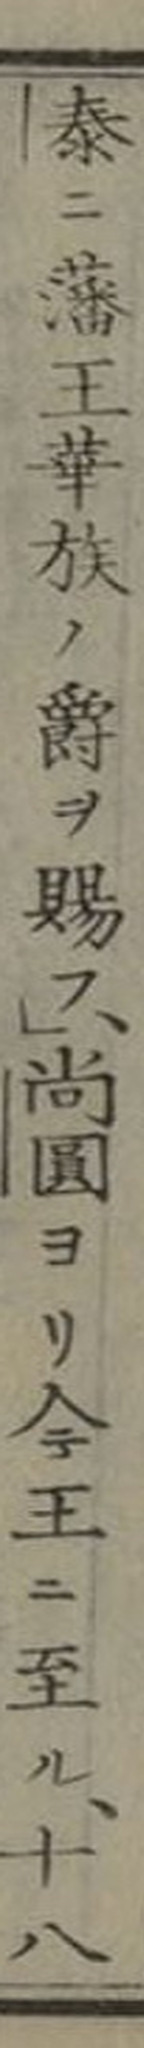泰ニ藩王華族ノ爵ヲ賜フ、」尚円ヨリ今王ニ至ル、十八
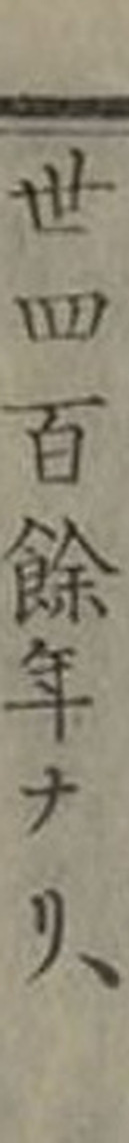世四百余年ナリ、
